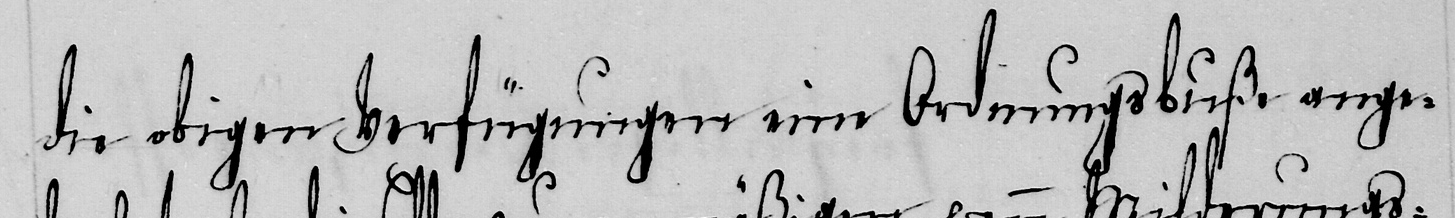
die obigen Verfügungen eine Ordnungsbuße ange¬
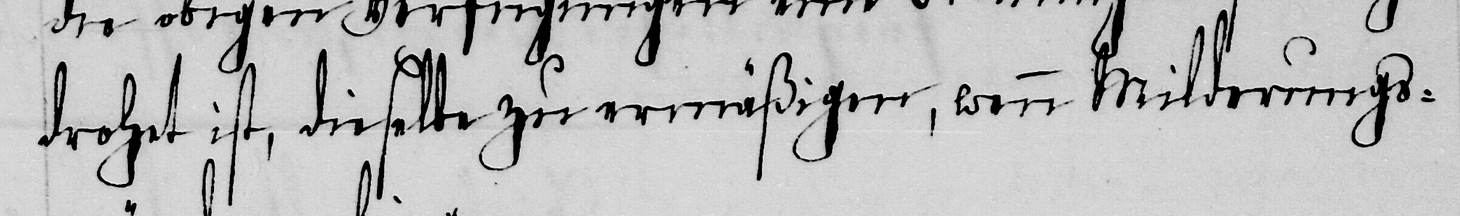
drohet ist, dieselbe zu ermäßigen, wenn Milderungs¬
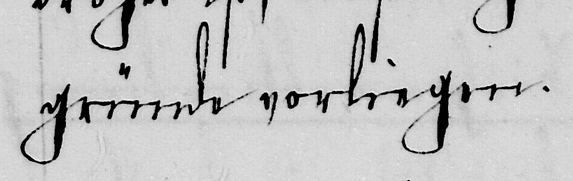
gründe vorliegen.
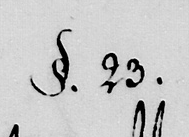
§. 23.
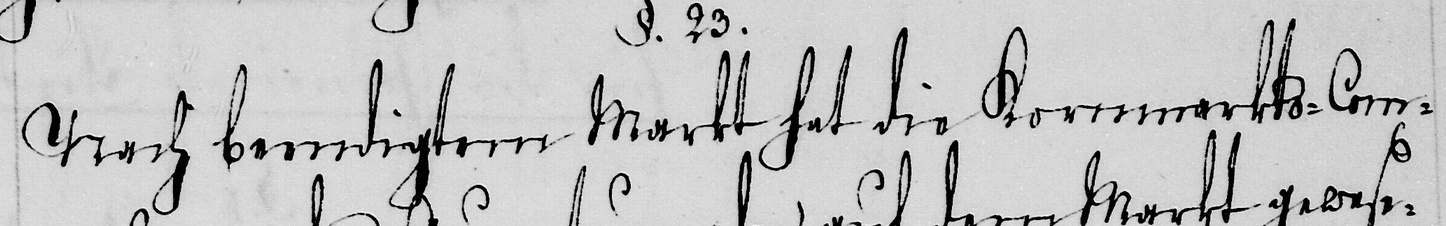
Nach beendigtem Markt hat die Kornmarkts-Com¬
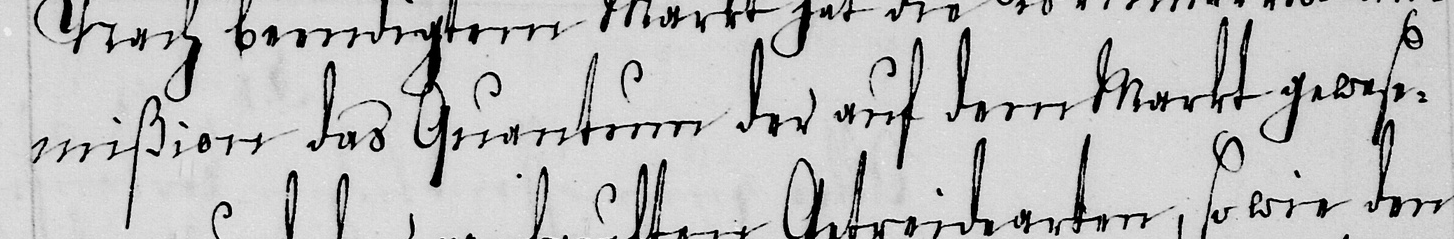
mißion das Quantum der auf dem Markt gewese¬
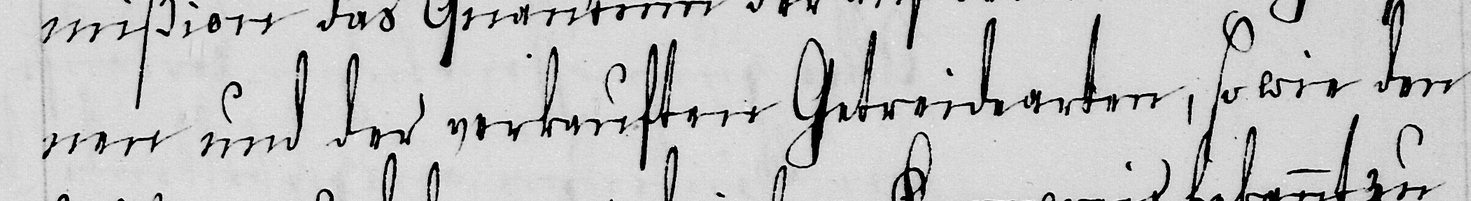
nen und der verkauften Getreidearten, so wie den
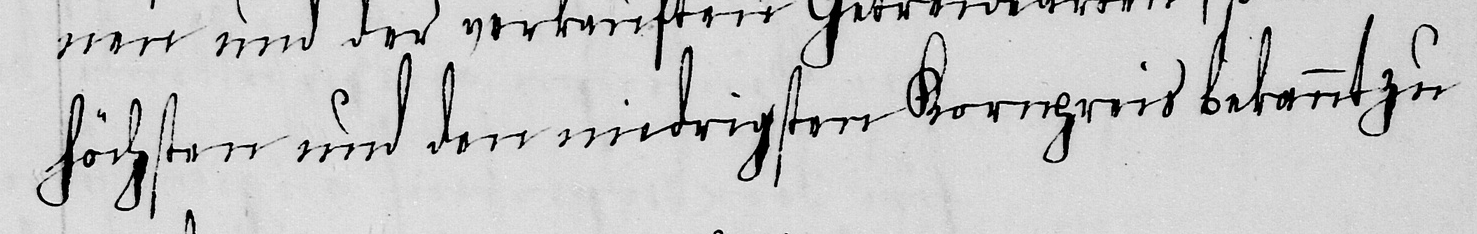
höchsten und den niedrigsten Kornpreis bekannt zu
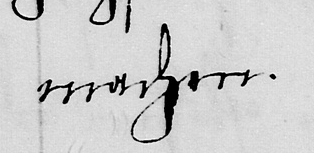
machen.
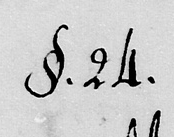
§. 24.
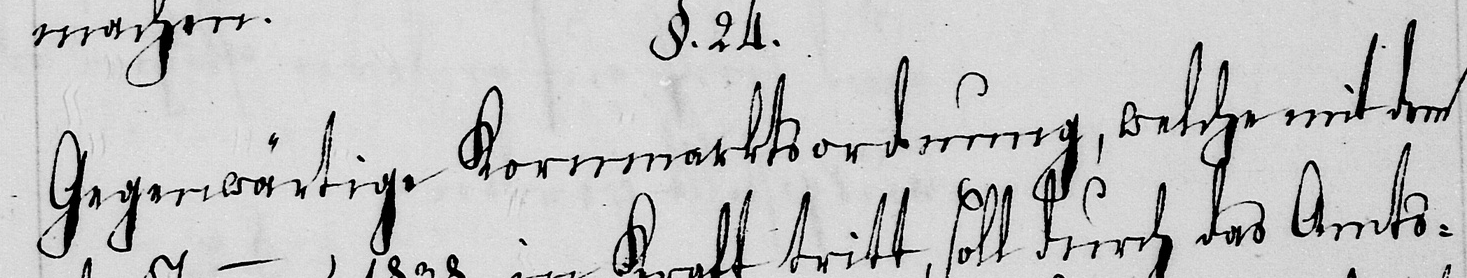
Gegenwärtige Kornmarktsordnung, welche mit dem
